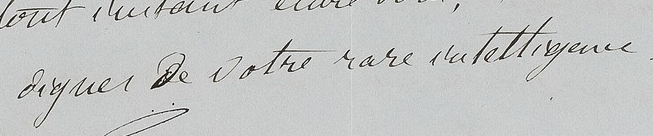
dignes de votre rare intélligence.
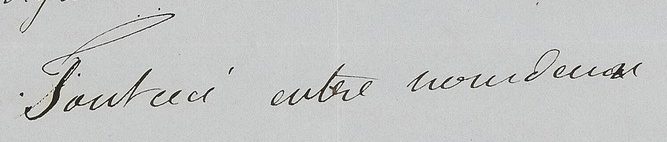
Tout ceci entre nous deux.
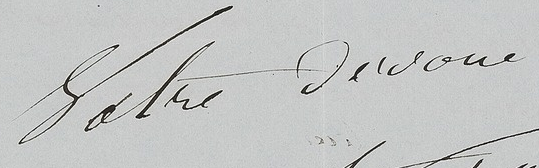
Votre dévoué
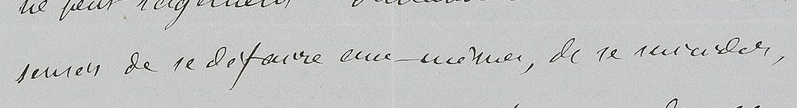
sensés de se défaire eux-mêmes, de se suicider,
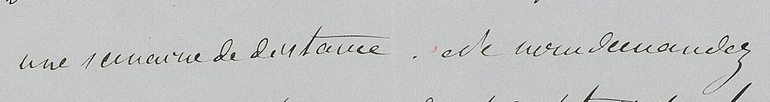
une semaine de distance. Ne nous demandez
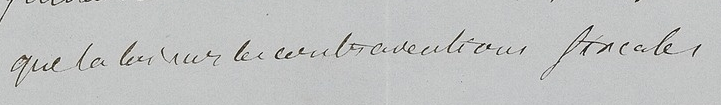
que la loi sur les contraventions fiscales
